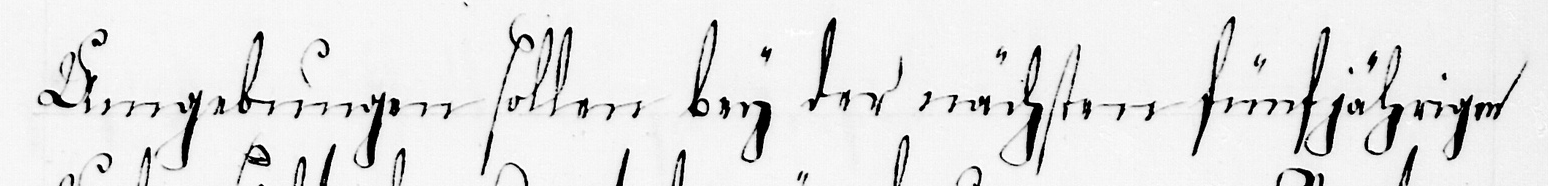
Umgebungen sollen bey der nächsten fünfjährigen
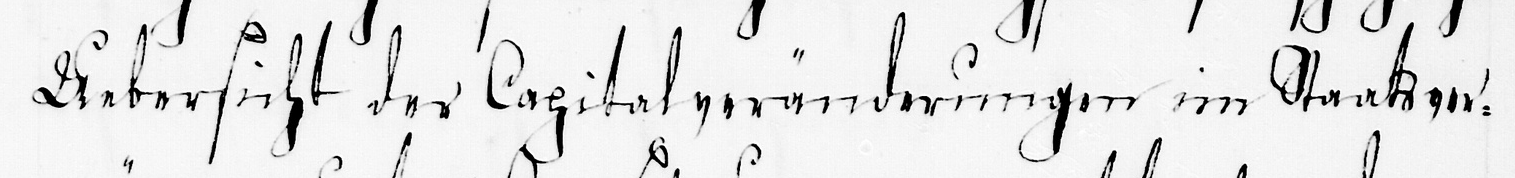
Uebersicht der Capitalveränderungen im Staatsver¬
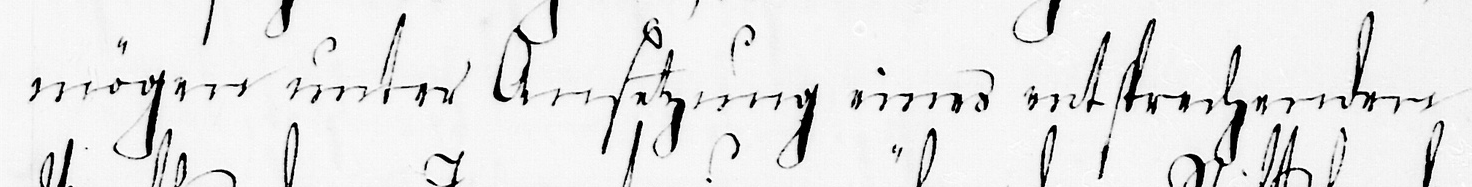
mögen unter Ansetzung eines entsprechenden
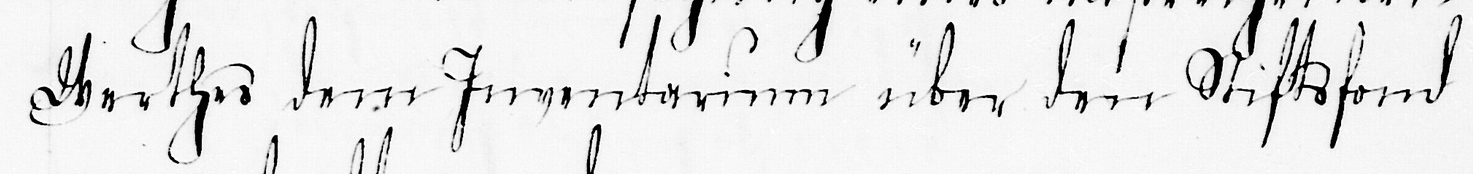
Werthes dem Inventarium über den Stiftsfond
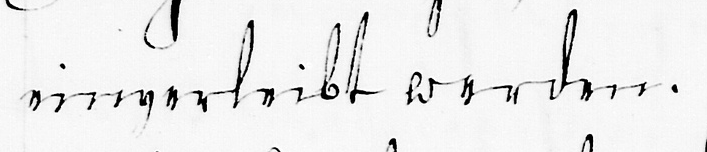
einverleibt werden.
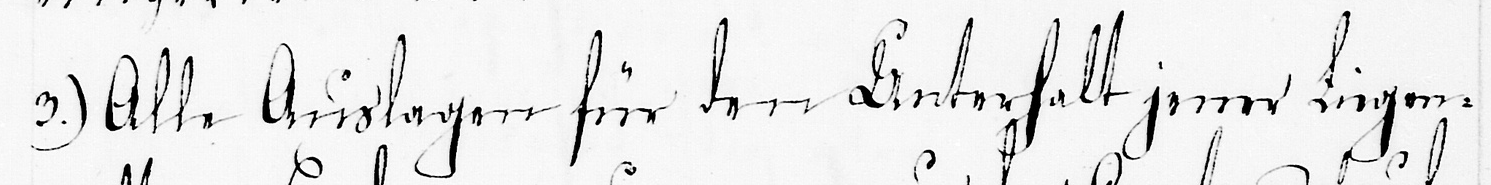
3.) Alle Auslagen für den Unterhalt jener Liegen¬
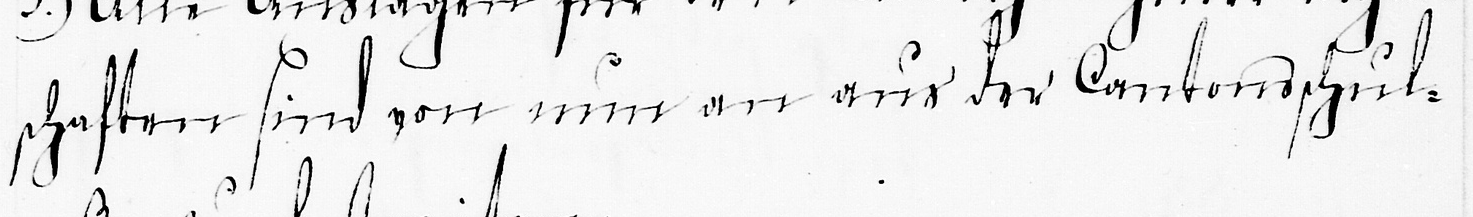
schaften sind von nun an aus der Cantonsschul¬
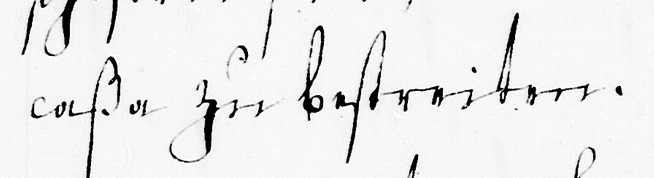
caßa zu bestreiten.
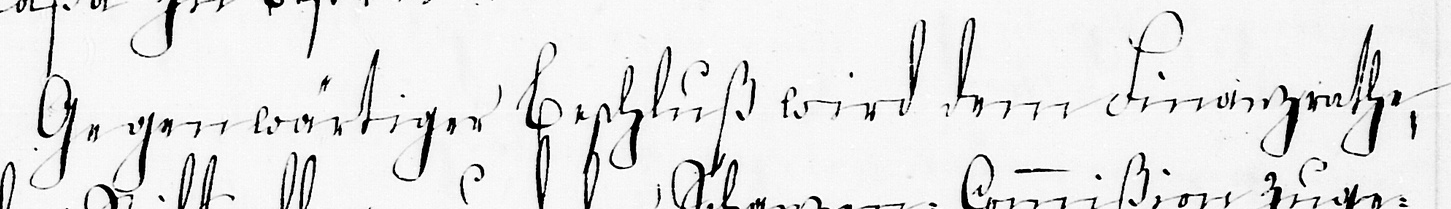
Gegenwärtiger Beschluß wird dem Finanzrathe,
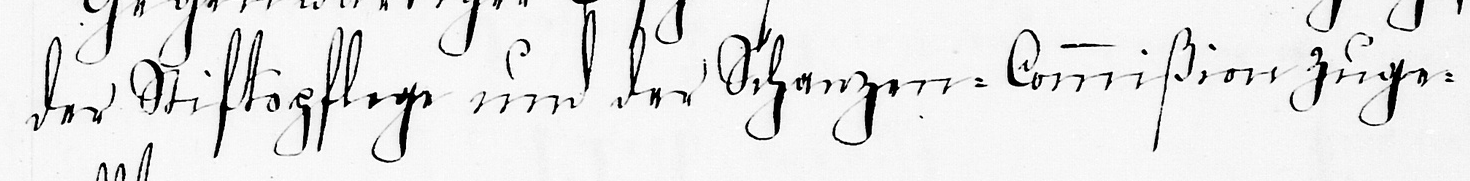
der Stiftspflege und der Schanzen-Commißion zuge¬
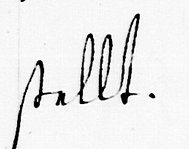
stellt.
